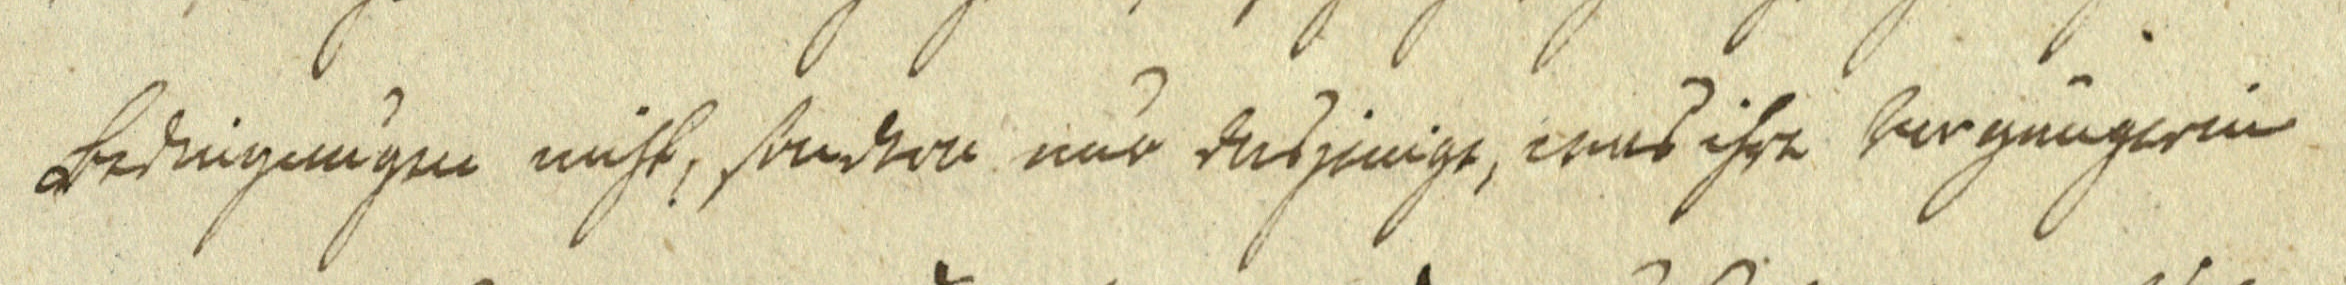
Bedingungen nicht, sondern nur dasjenige, was ihre Vorgängerin
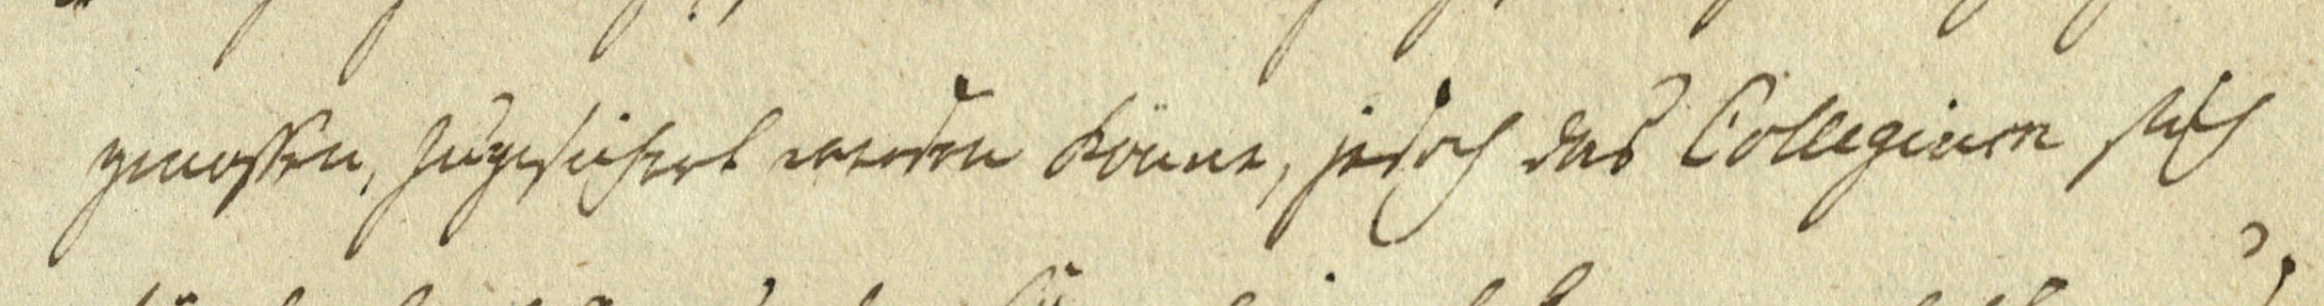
genossen, zugesichert werden könne, jedoch das Collegium sich
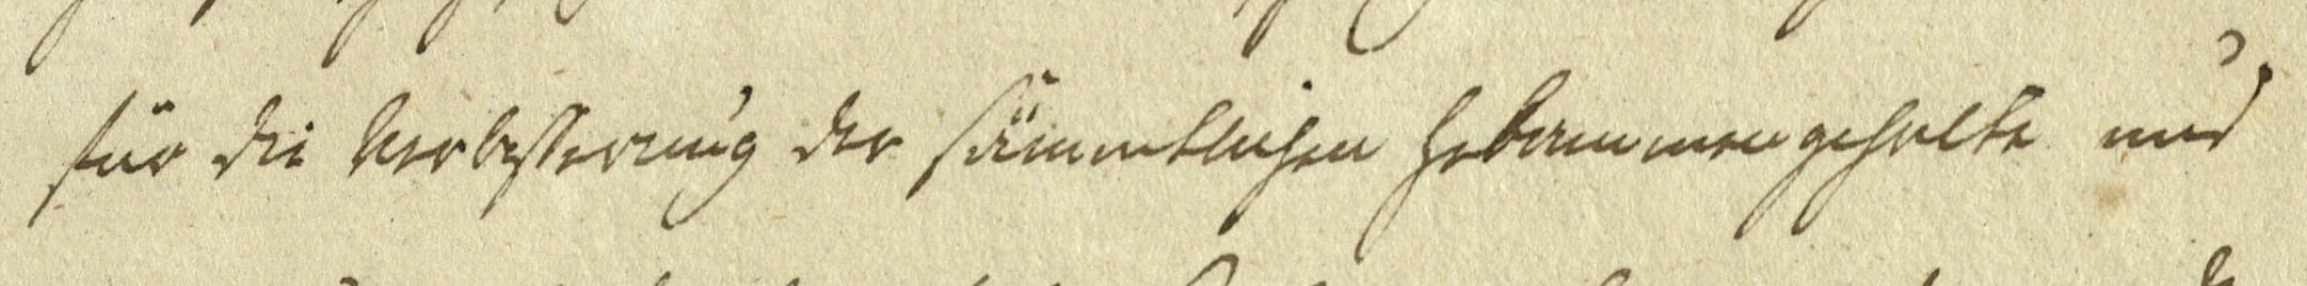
für die Verbesserung der sämmtlichen Hebammengehalte und
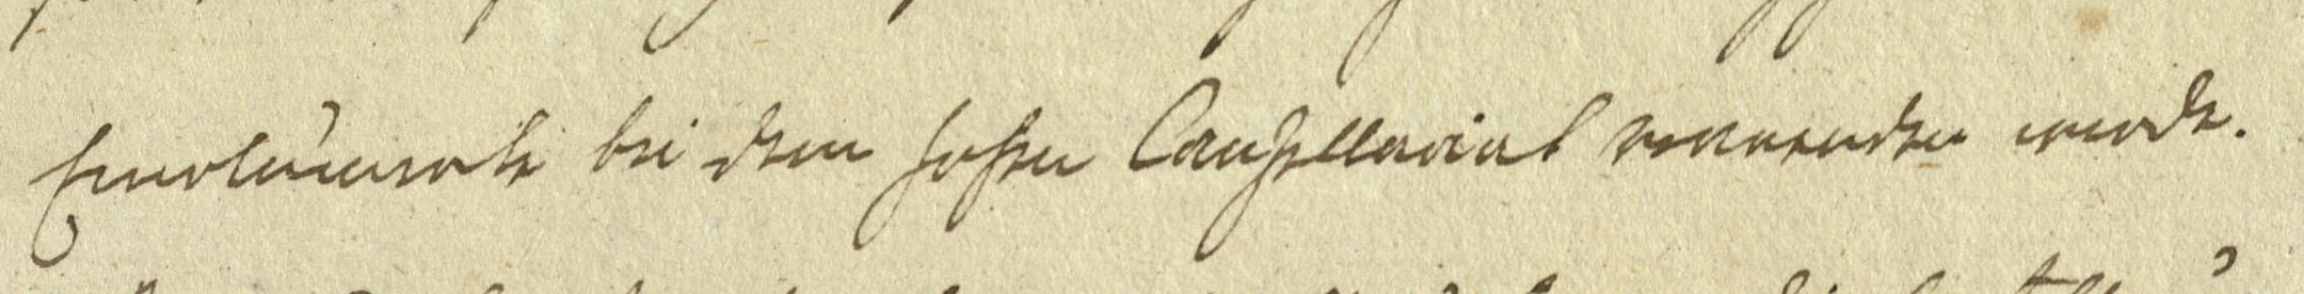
Emolumente bei dem hohen Canzellariat verwenden werde.
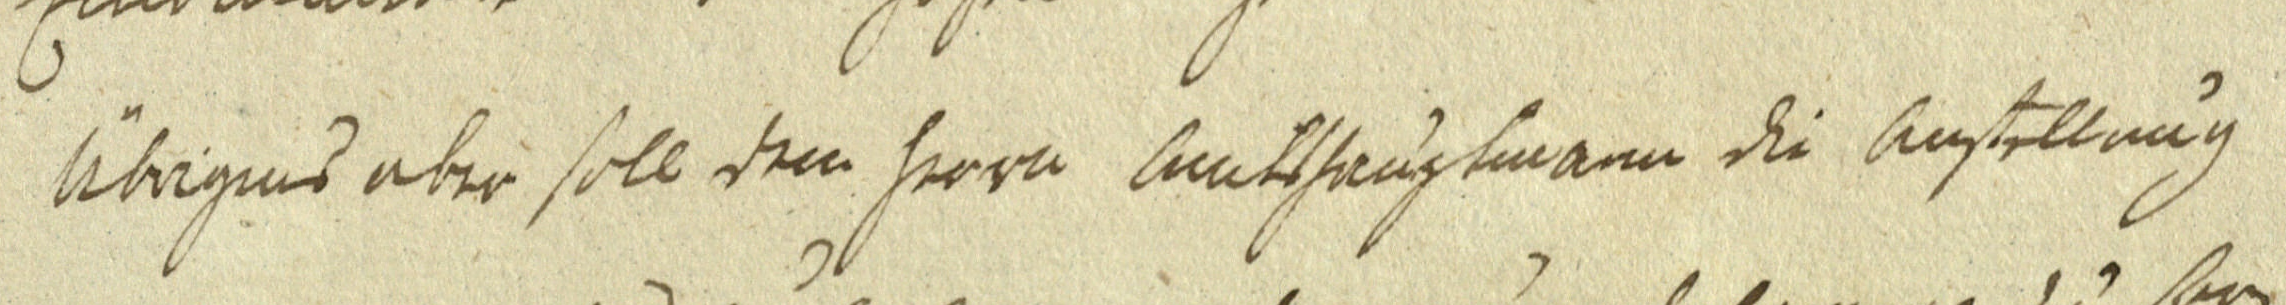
Übrigens aber soll dem Herrn Amtshauptmann die Anstellung
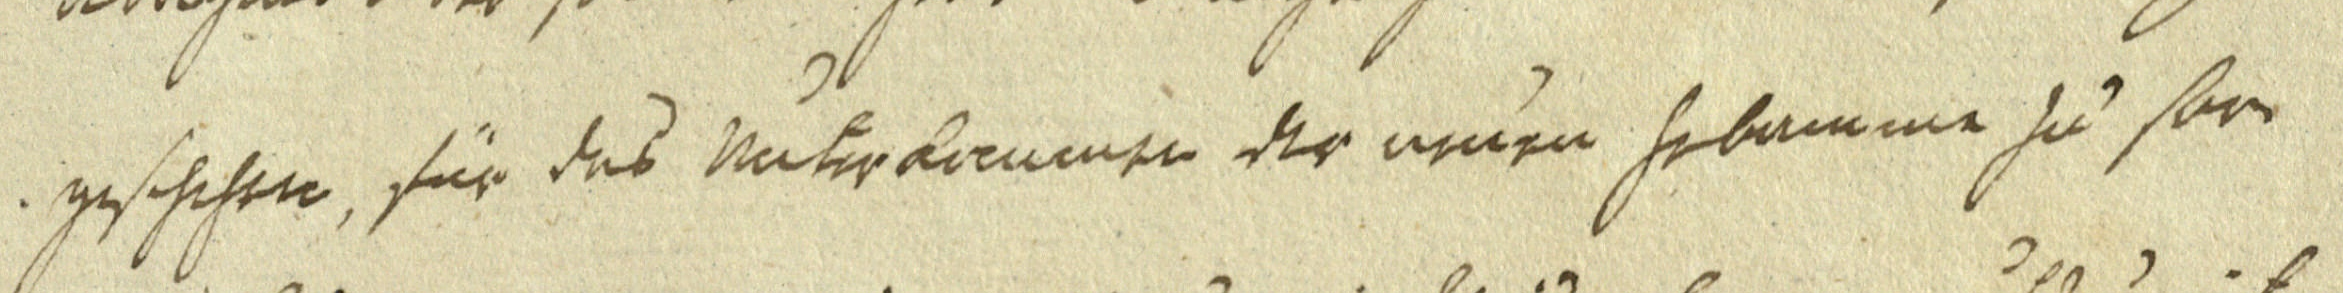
geschehen, für das Unterkommen der neuen Hebamme zu sor¬
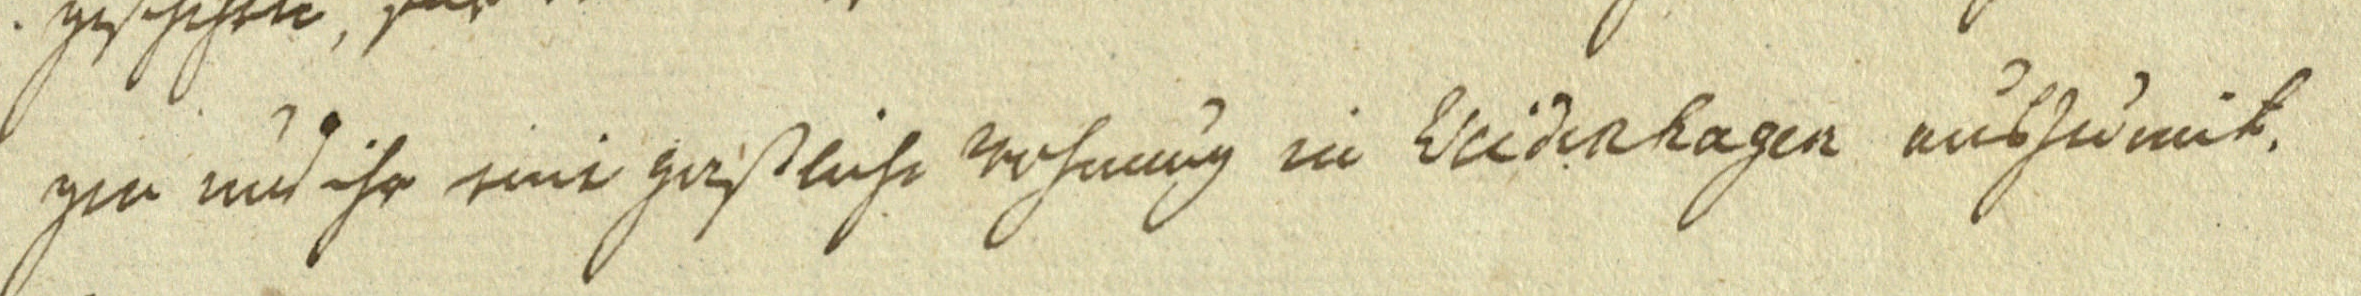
gen und ihr eine paßliche Wohnung in Weidenhagen auszumit¬
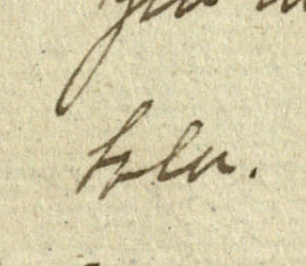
teln.
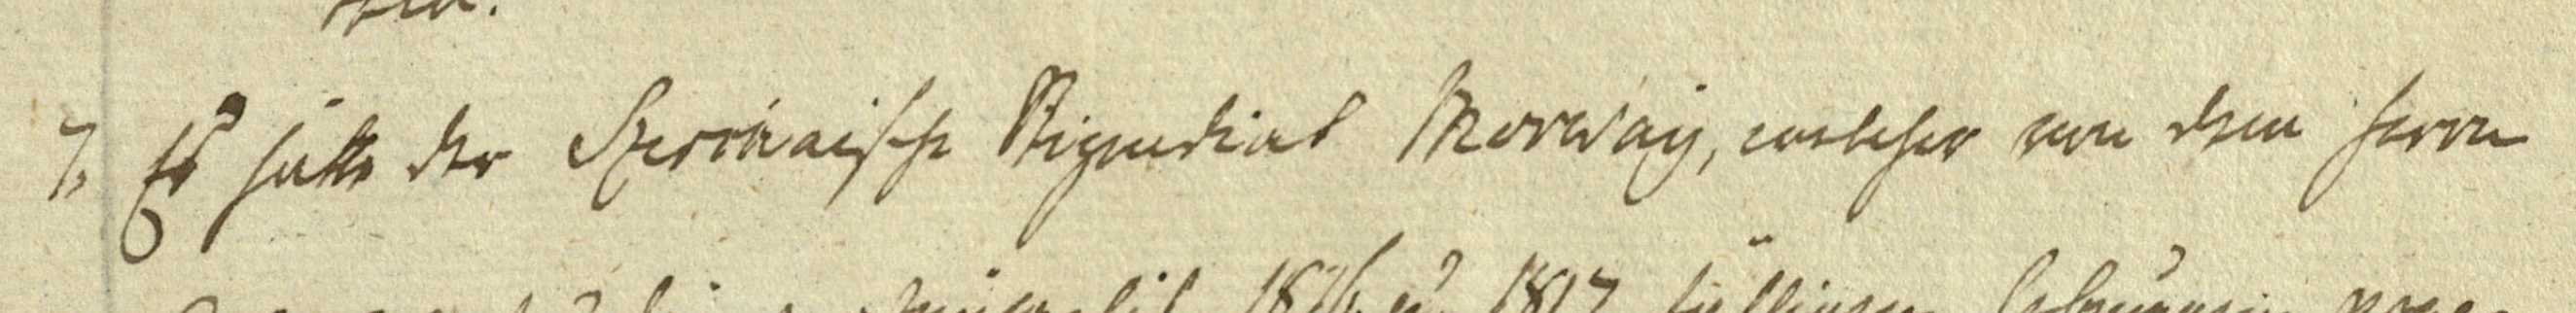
7. Es hätte der Szermaische Stipendiat Morwaÿ, welcher von dem Herrn
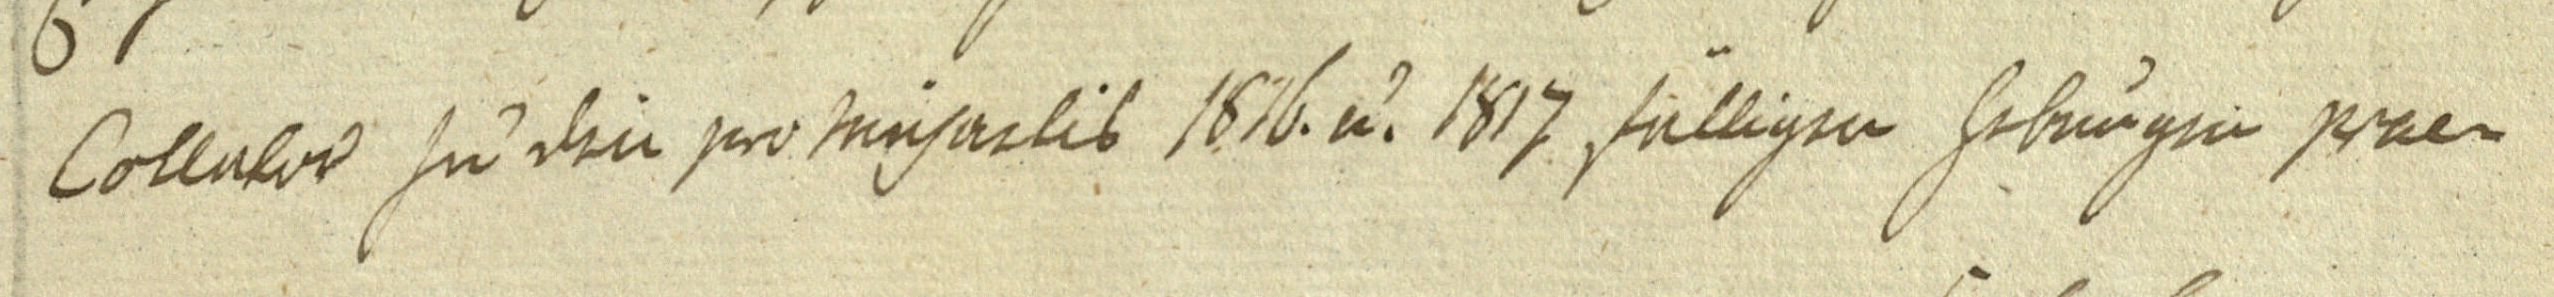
Collator zu den pro Michaelis 1816. u. 1817 fälligen Hebungen prae¬
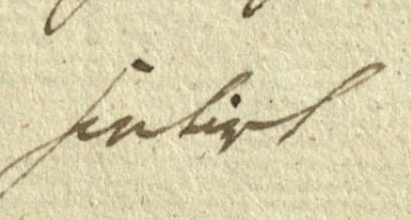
sentirt
